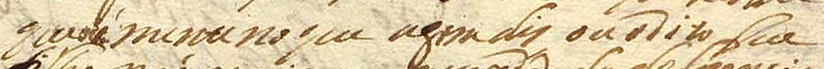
que somente no que agora dis ou o dito seu
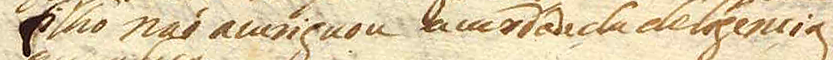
filho naõ aueriguou a uerdade da deligencia
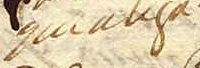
que alega.
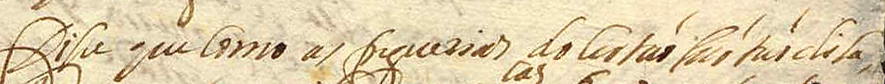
Disse que como as freguezias do Certaõ saõ taõ dila
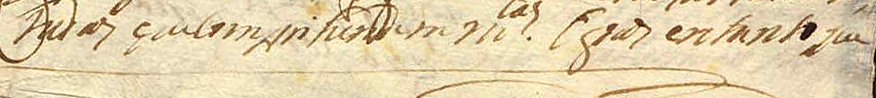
tadas que comprihendem m.tas legoas en tanto que
